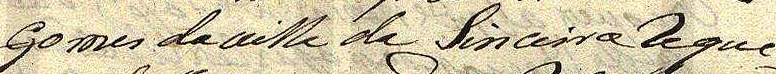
Gomes da uilla da Sirieira Reque
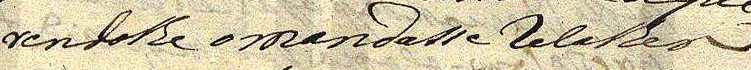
rendolhe o mandasse Recolher
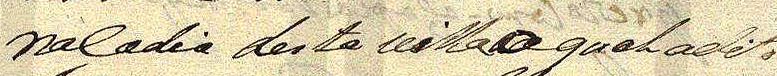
na cadea desta uilla o qual o dito
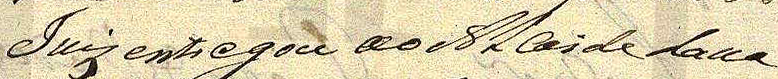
Iuiz entregou ao Alcaide da ua
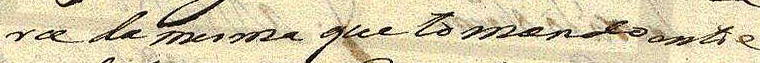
ra da mesma que tomando entre
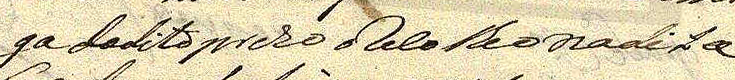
ga do dito prezo o Recolheo na dita
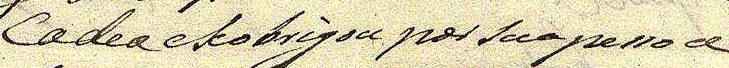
Cadea e se obrigou por sua pessoa
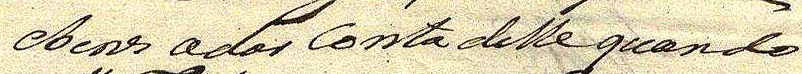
e bens a dar conta delle quando
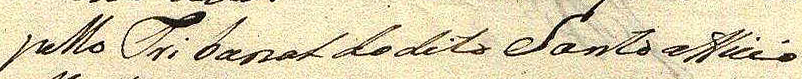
pello Tribunal do dito Santo officio
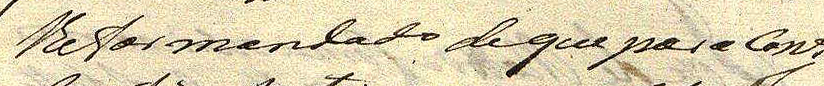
lhe for mandado de que para cons
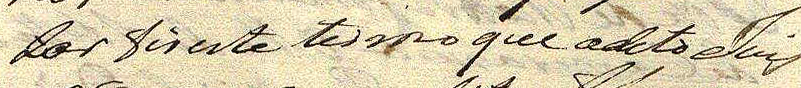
tor fis este termo que o dito Iuis
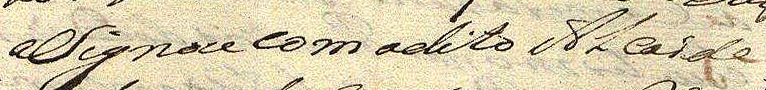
aSignou com o dito Alcaide
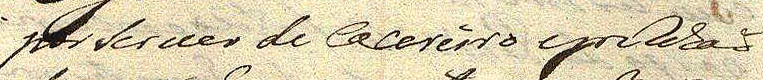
por seruer de cacereiro e por Rezaõ
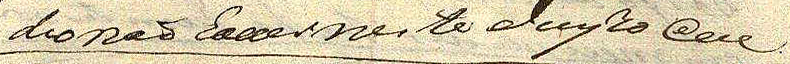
de o não hauer neste Iuyzo e eu
